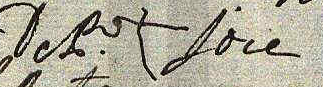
De P.o + Joze
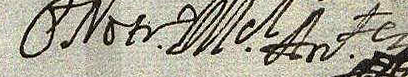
O Notr.o M.el Anto
